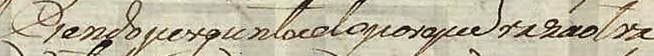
E sendo perguntado porque razaõ tra
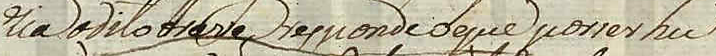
zia o dito breve Respondeo que por ser hu
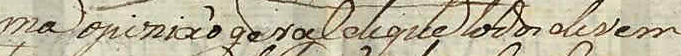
ma opiniaõ geral de que todos devem
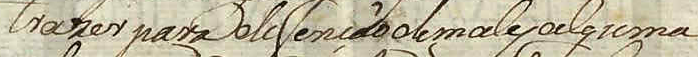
trazer para defençaõ de males alguma
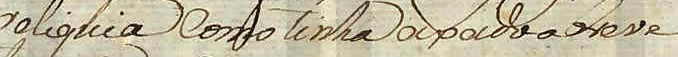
reliquia Como tinha axado o breve
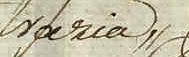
trazia//
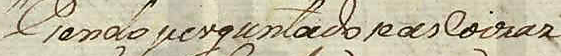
E sendo perguntado se as coizaz
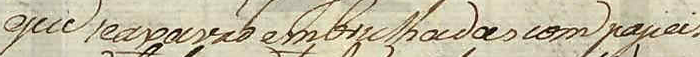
que se axavaõ embrulhadas com papeis
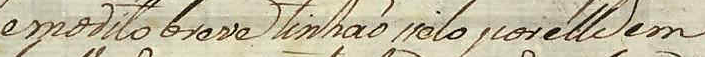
em o dito breve tinhaõ sido por elle em
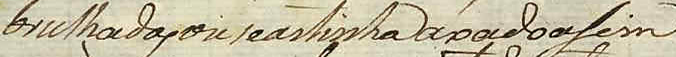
brulhadas ou se as tinha axado asim
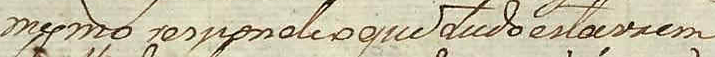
mesmo respondeo que tudo estava em
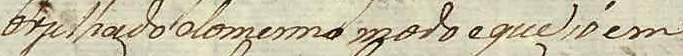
brulhado do mesmo modo e que só em
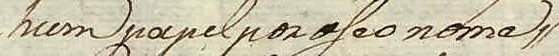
hum papel poz o seo nome//
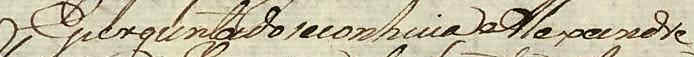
E perguntado se conhecia Alexandre
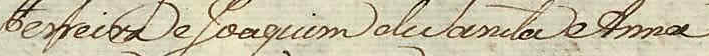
Ferreira e Joaquim de Sancta Anna
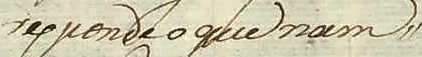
respondeo que nam//
